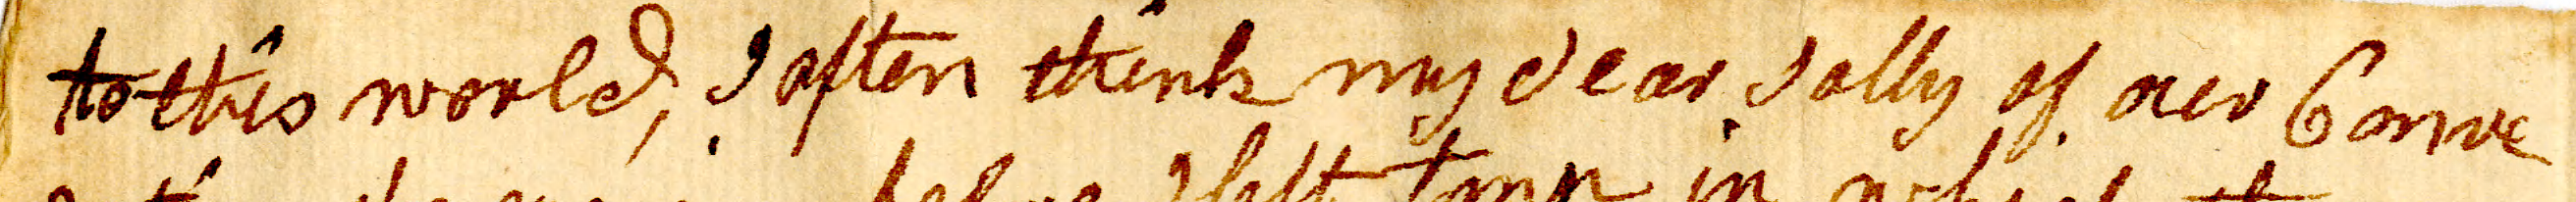to this world, I often think my dear Sally of our Conve
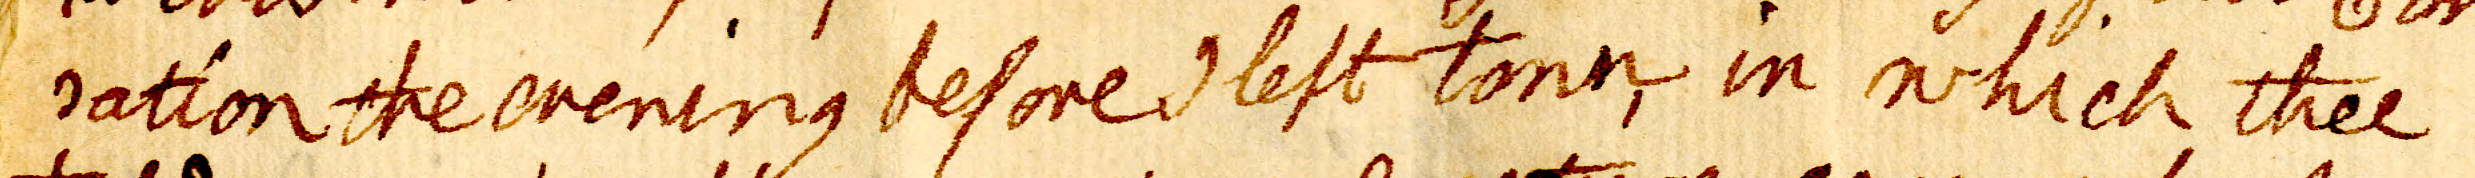sation the evening before I left town in which thee
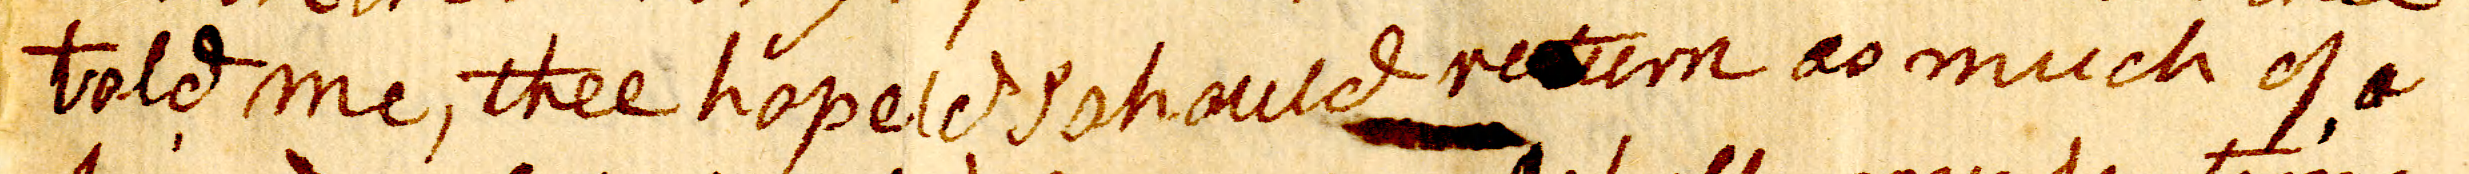told me, thee hoped I should return as much of a
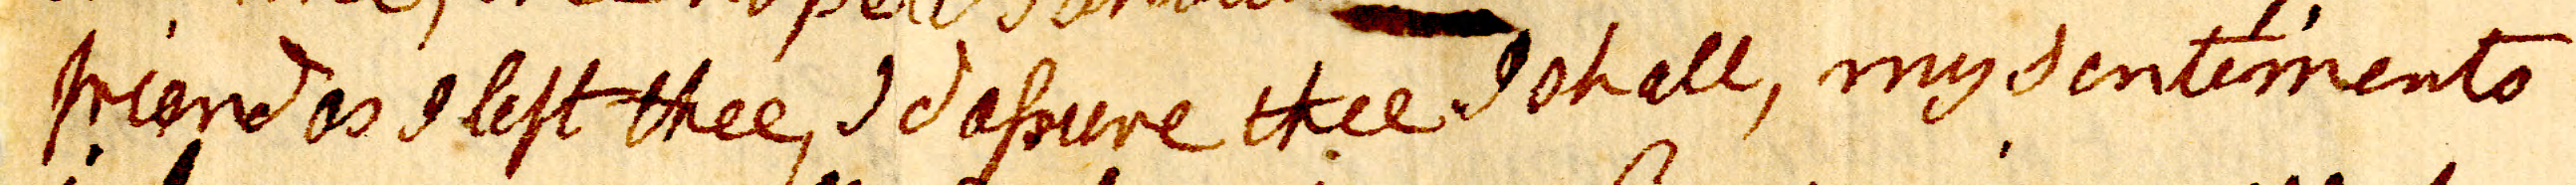friend as I left thee, Id assure thee I shall, my sentiments
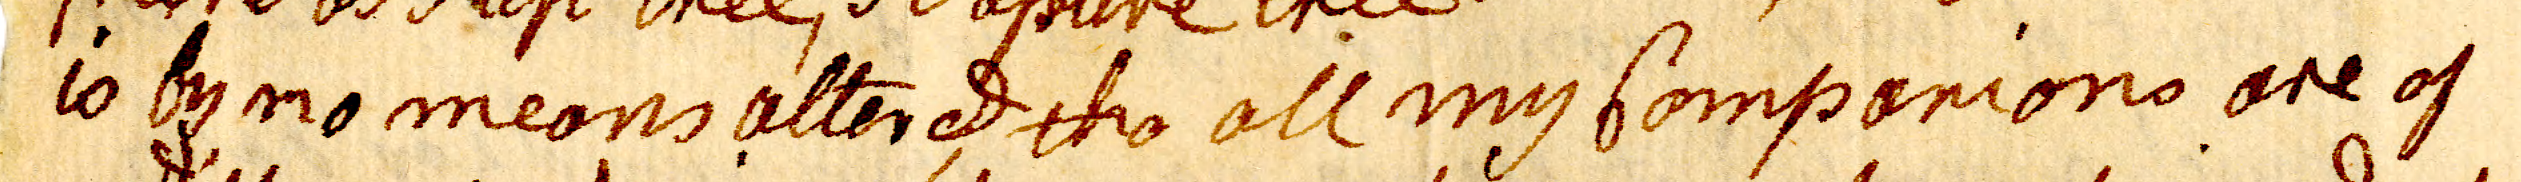is by no means alterd tho all my Companions are of
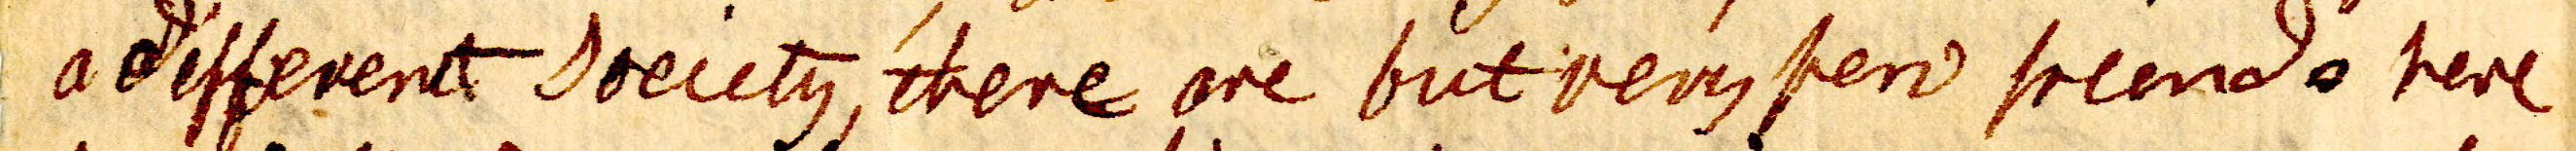a different society, there are but very few friends here
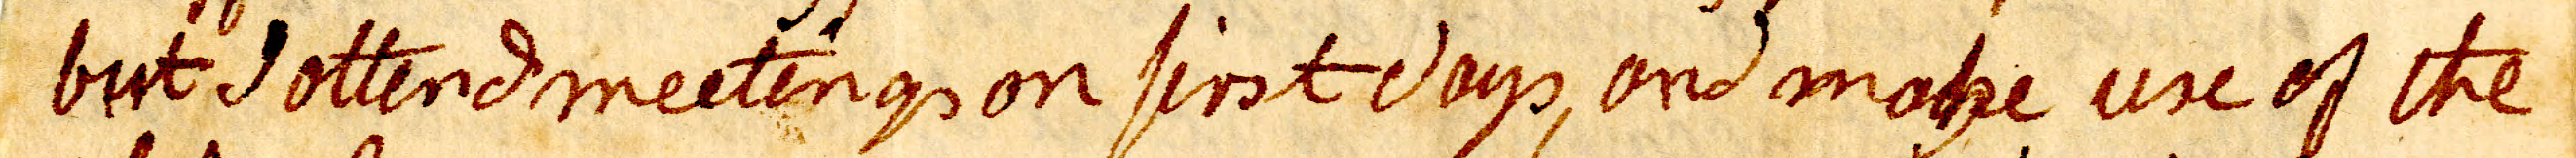but I attend meetings on first days, and make use of the
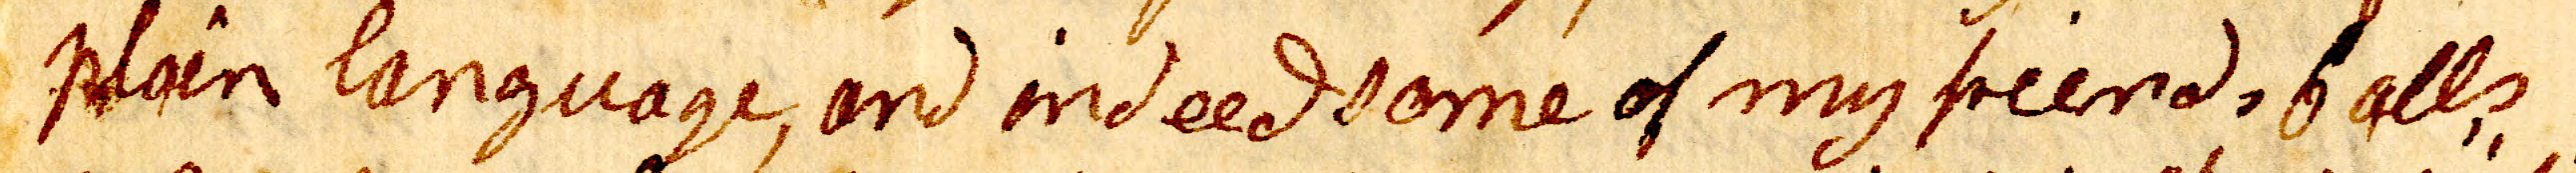plain language, and indeed some of my friends calls
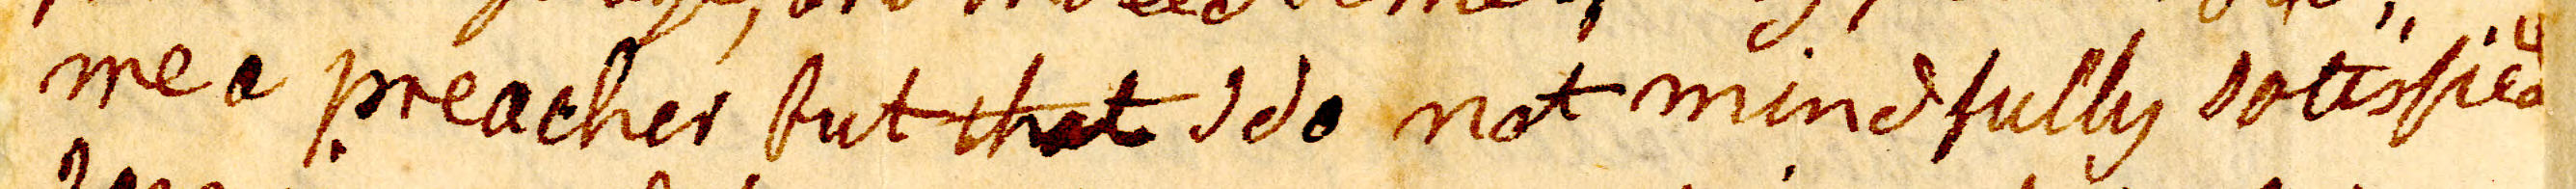me a preacher but that I do not mind fully satisfied
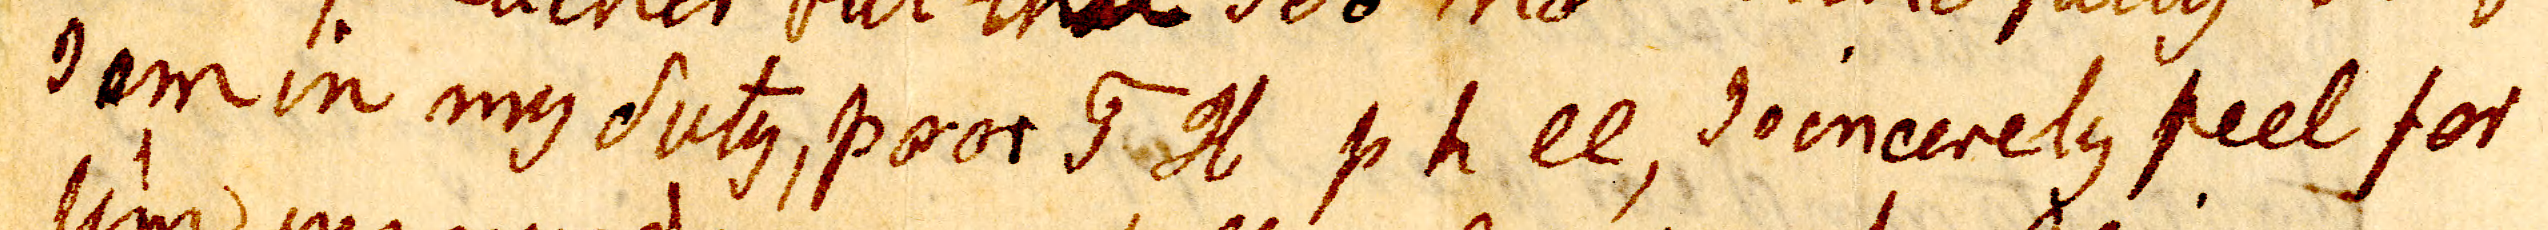I am in my duty, poor F H ph ll, I sincerely feel for
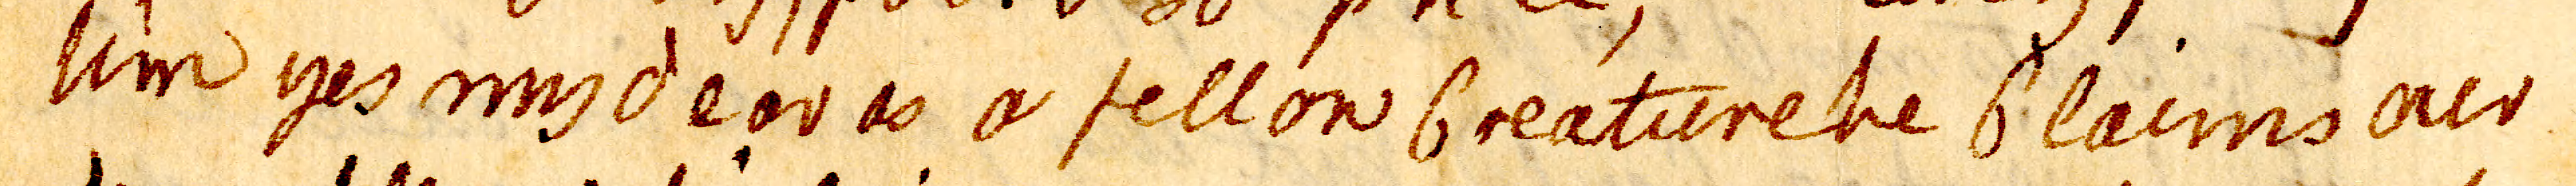him yes my dear as a fellow creature he Claims our
